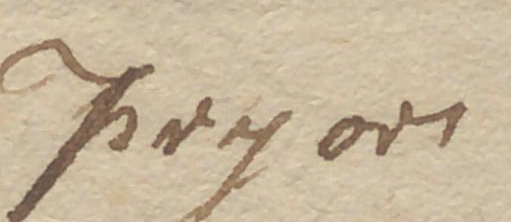pryors
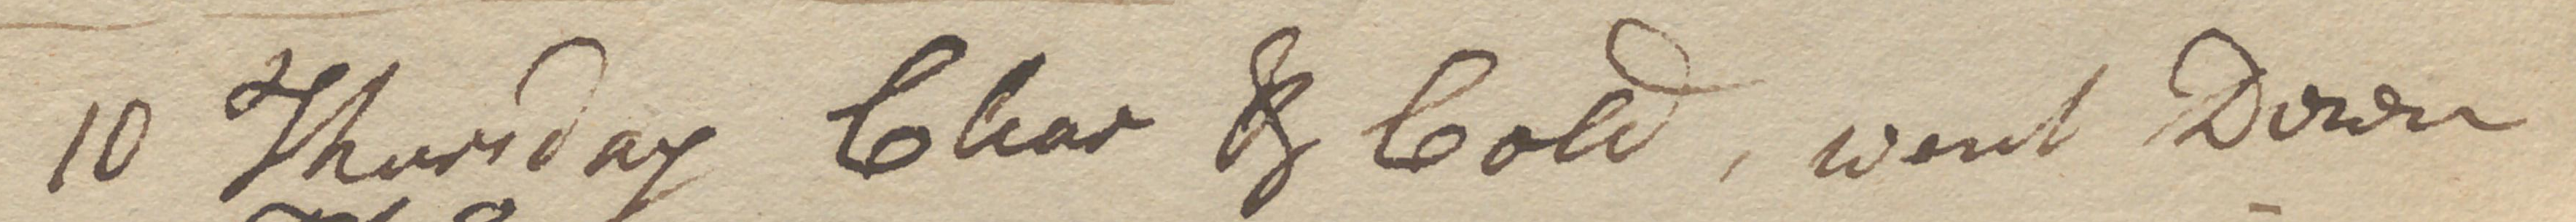10 Thursday Clear & Cold, went Down
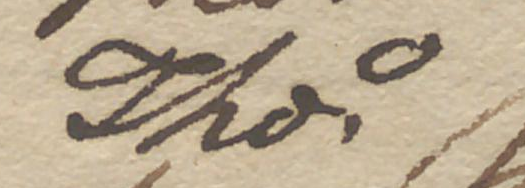Tho^s.
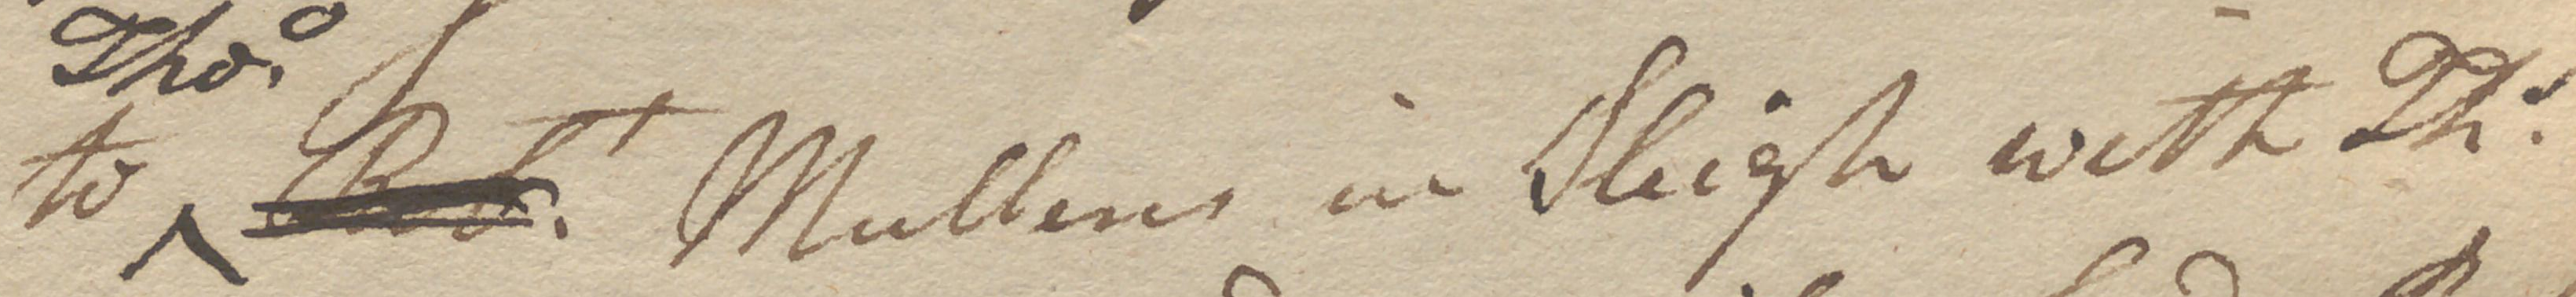to ^ [Rob^t.] Mullins in Sleigh with Th^s.
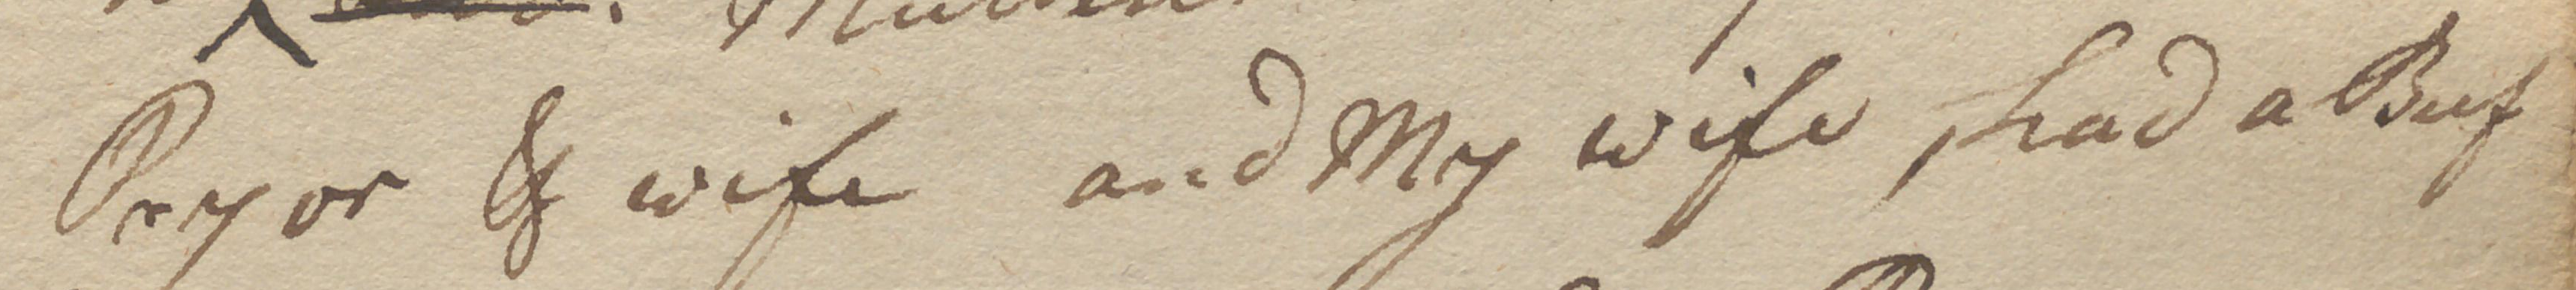Pryor & wife and My wife, had a Beef
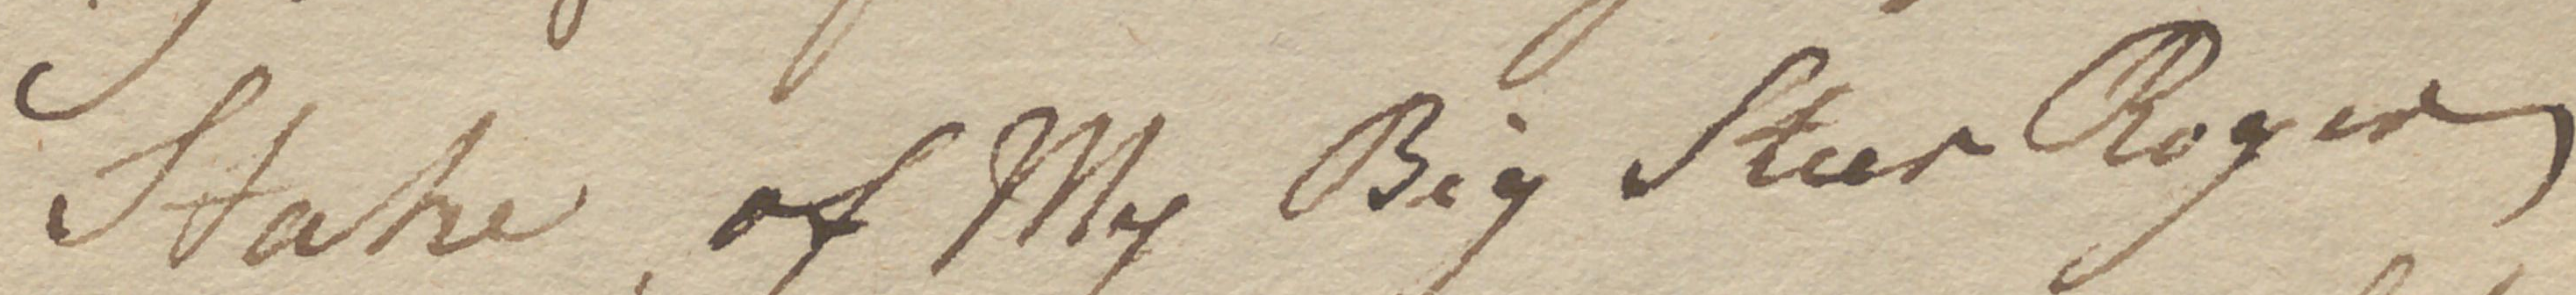Stake of My Big Steer Roger
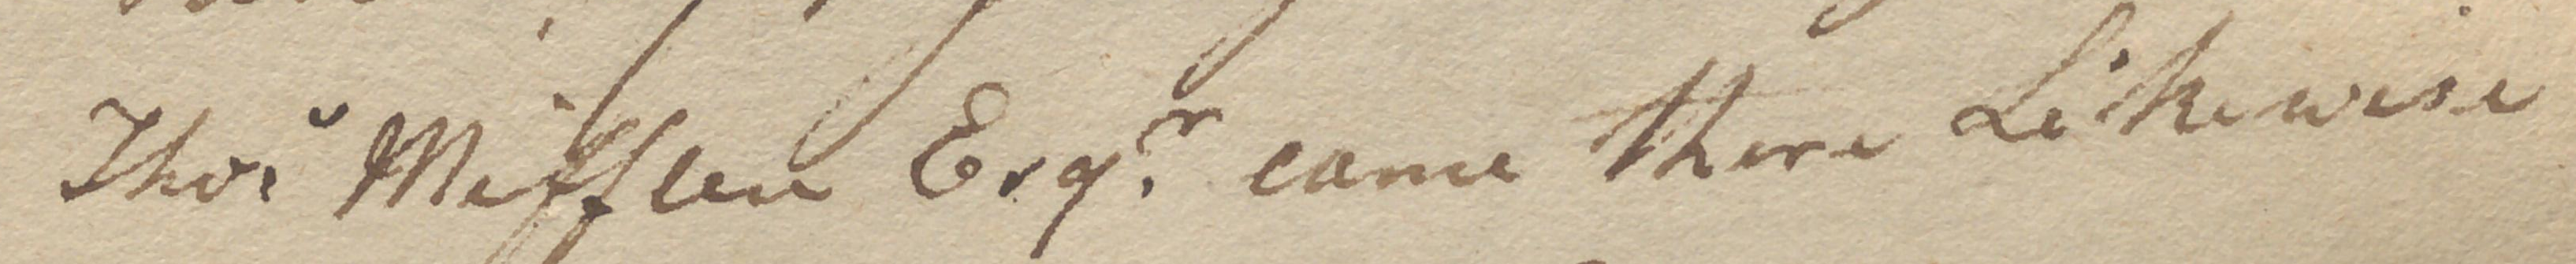Tho^s. Mifflin Esq^r. came there Like wise
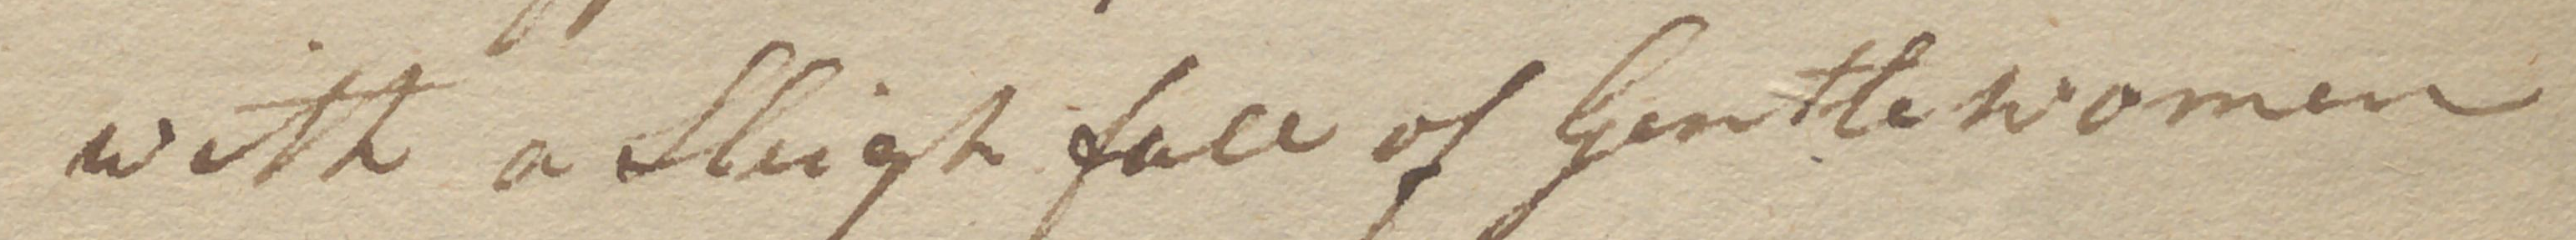with a Sleigh full of Gentlewomen
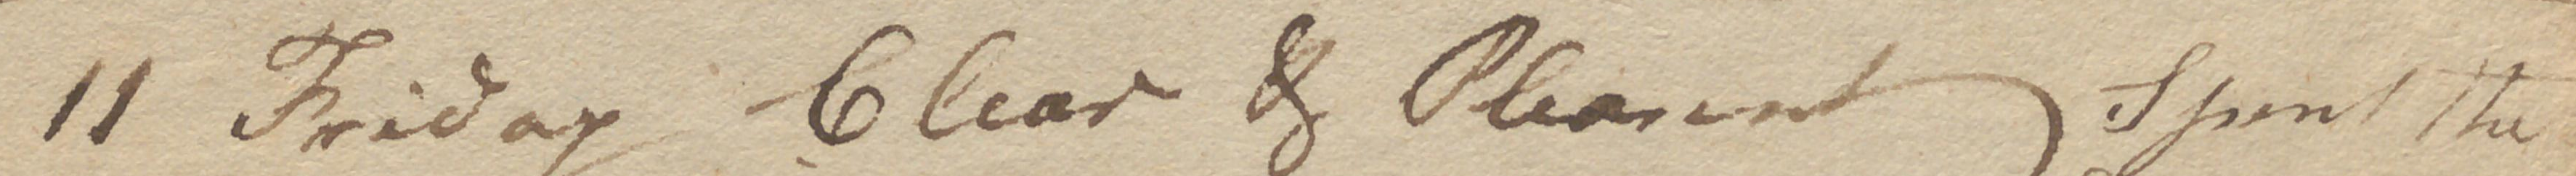11 Friday Clear & Pleasent Spent the
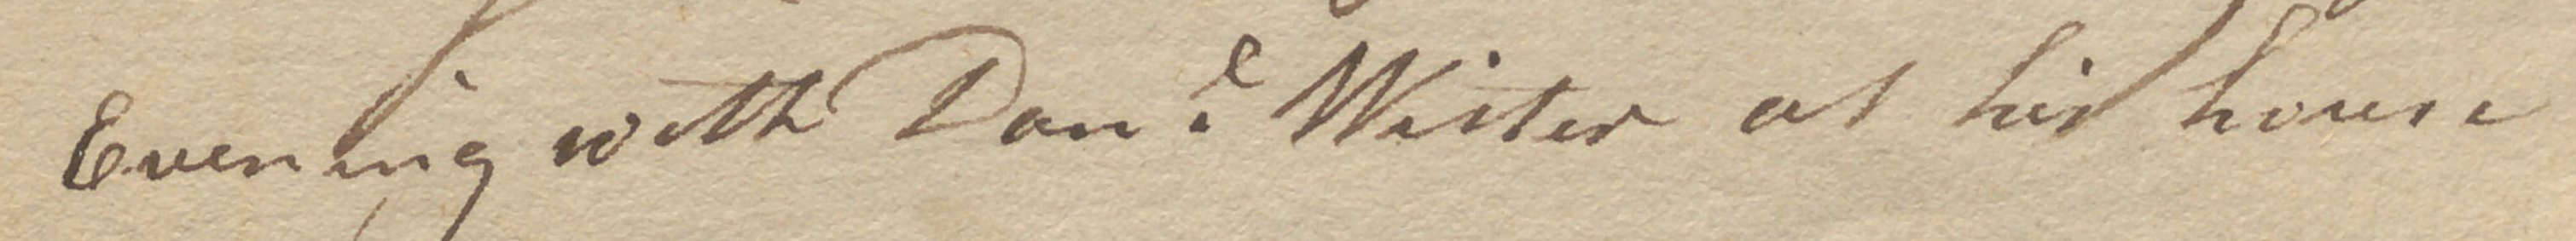Evening with Dan^l. Wister at his house
